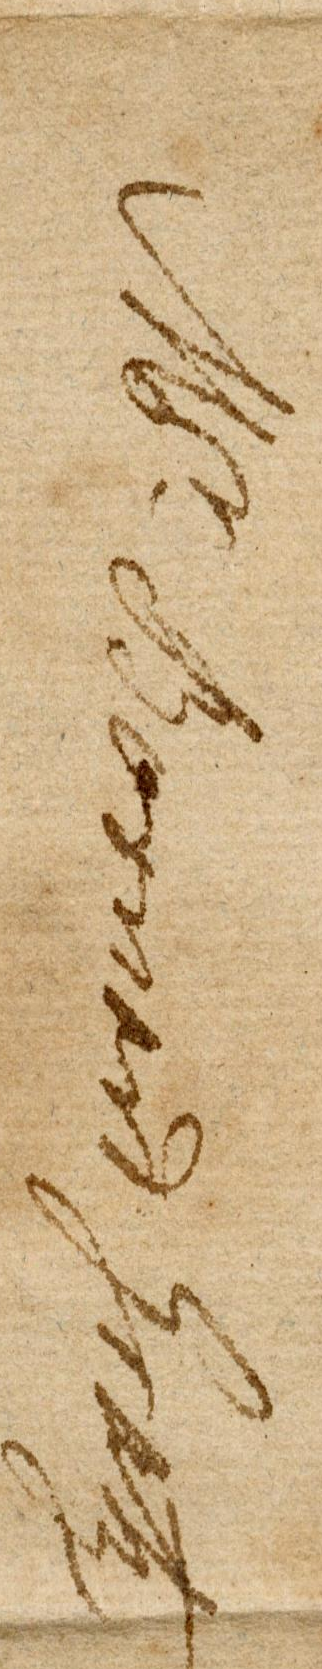M^r Barnard Gratz
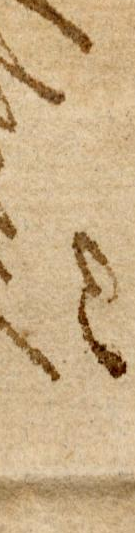at
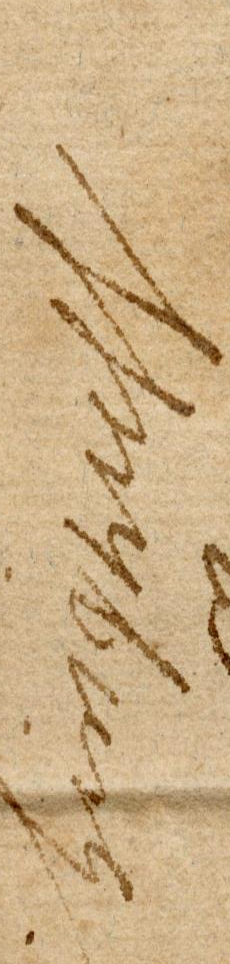W^mburg
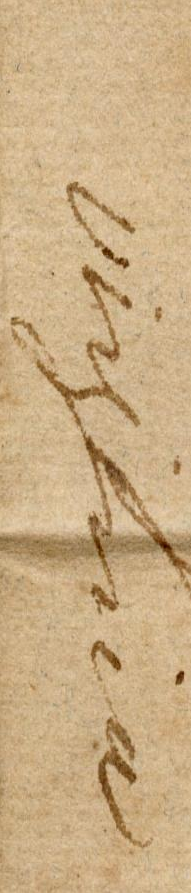Virginia
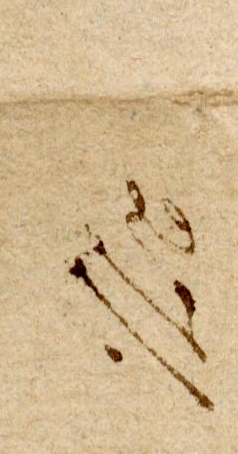271
